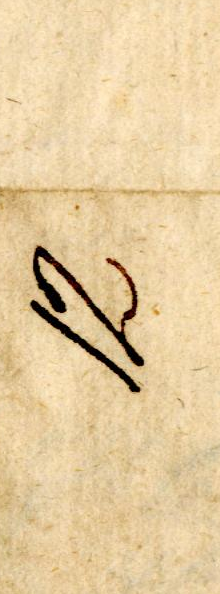12
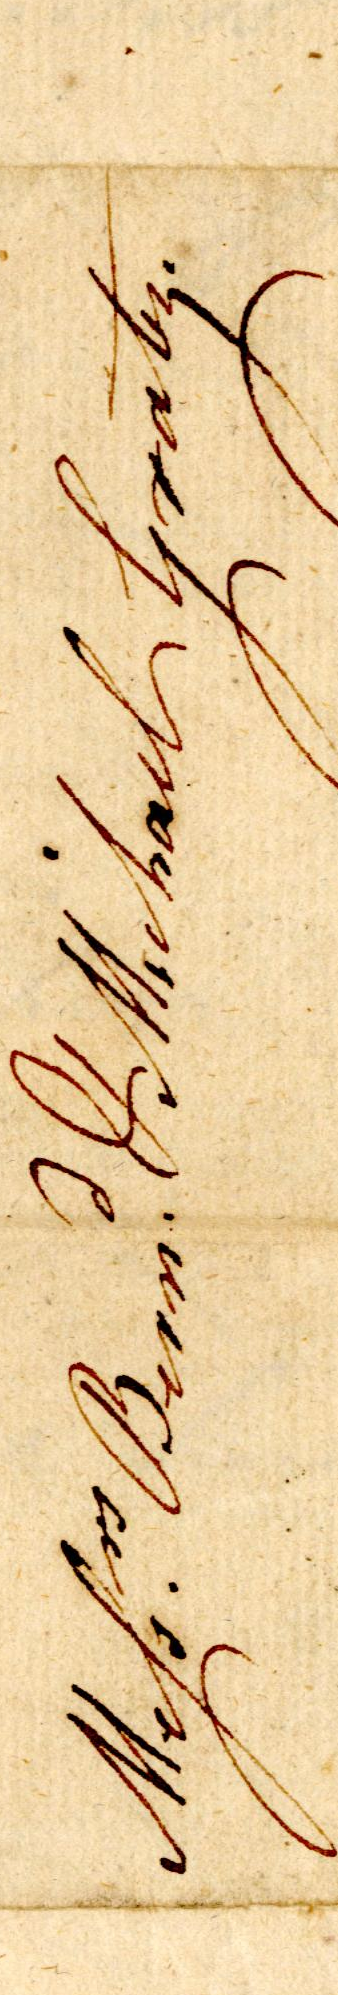Mess^rs. Bern^d. & Michael Gratz.
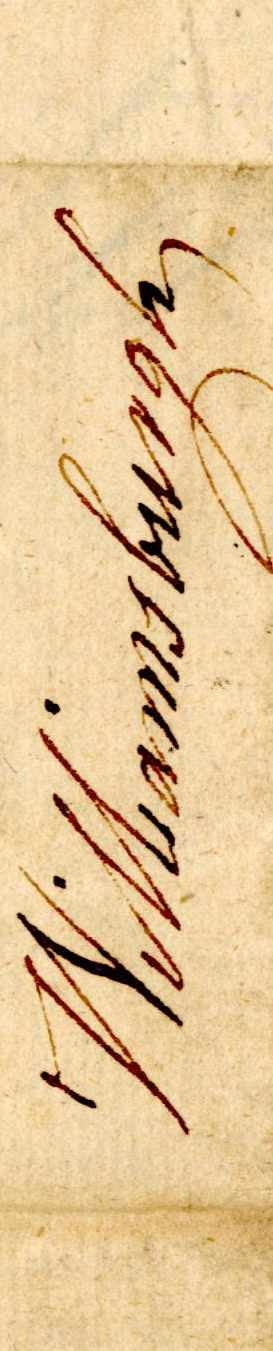WIlliamsburgh
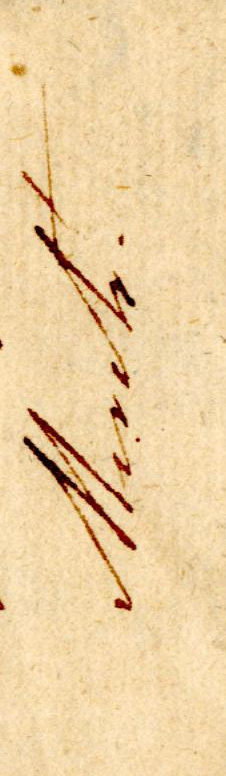Merch^t
